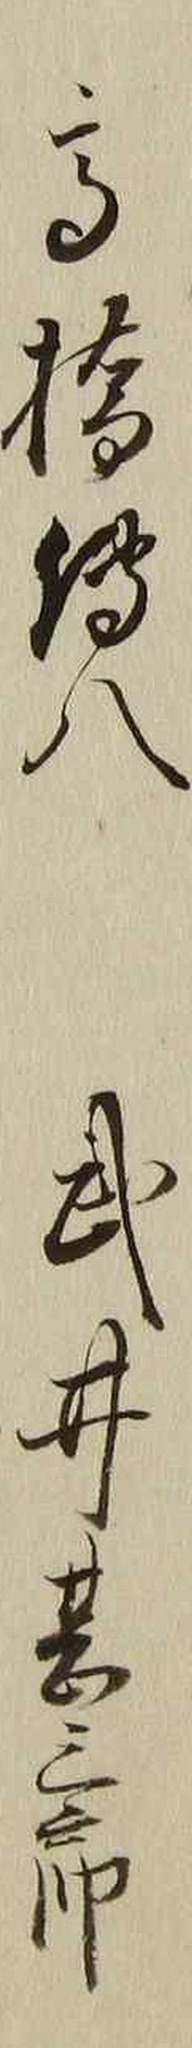高橋伝八武井甚三郎
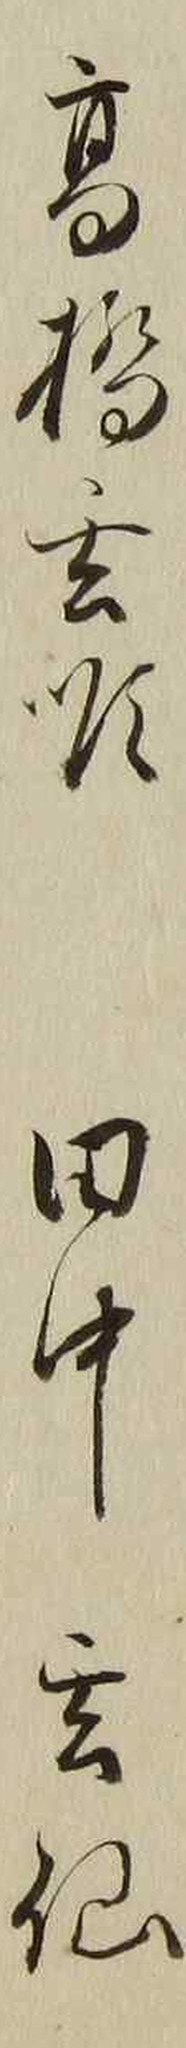高橋玄順田中玄仙

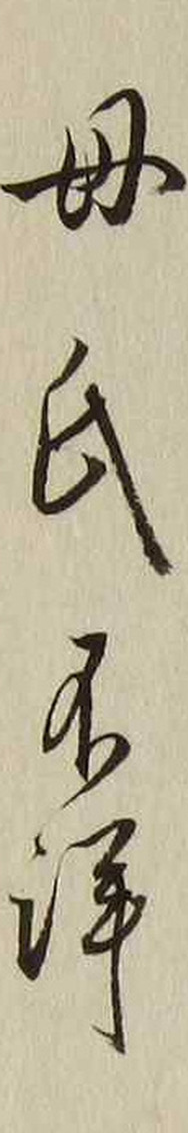母氏不詳
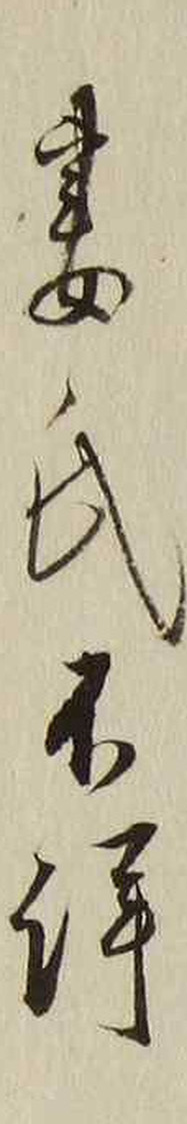妻氏不詳
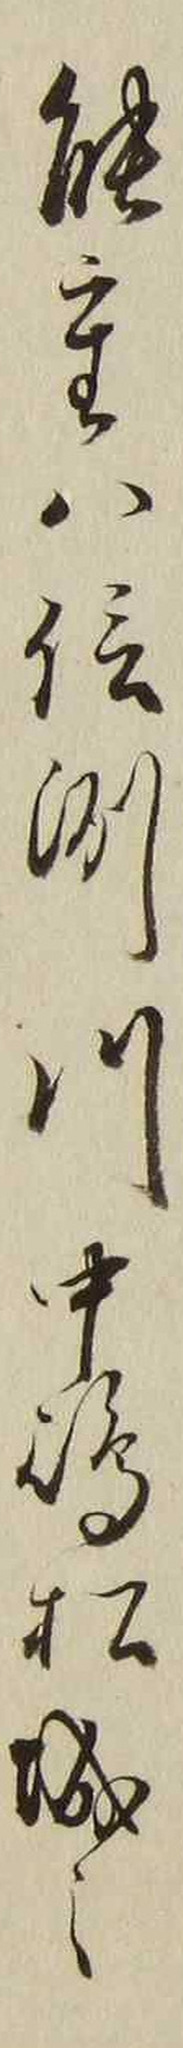能重ハ信州川中嶋松城之
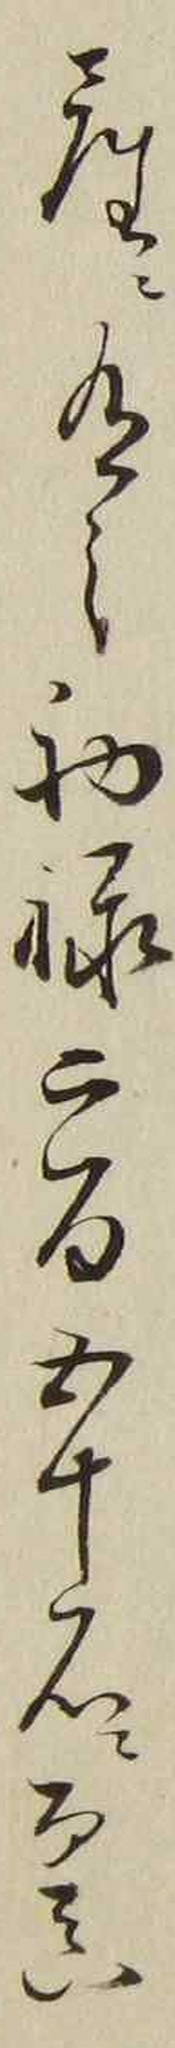産ニ有之初禄二百五十石ニ而真

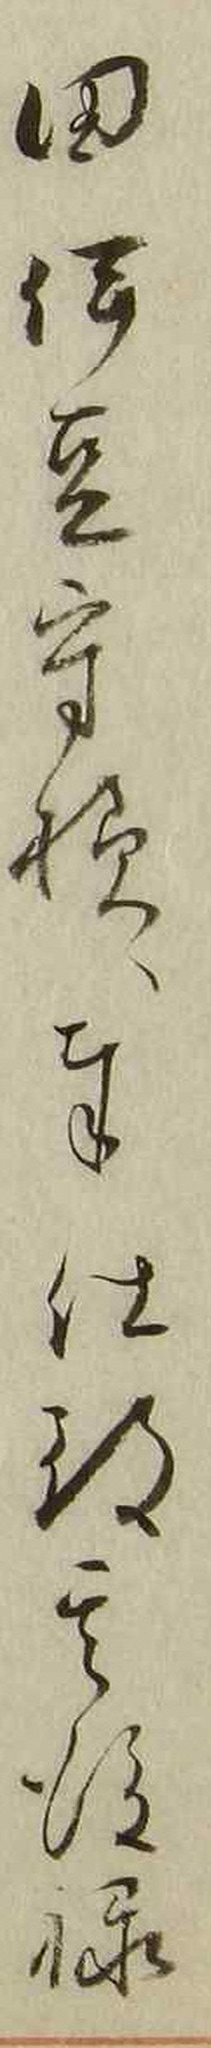田伊豆守様へ奉仕致其後禄
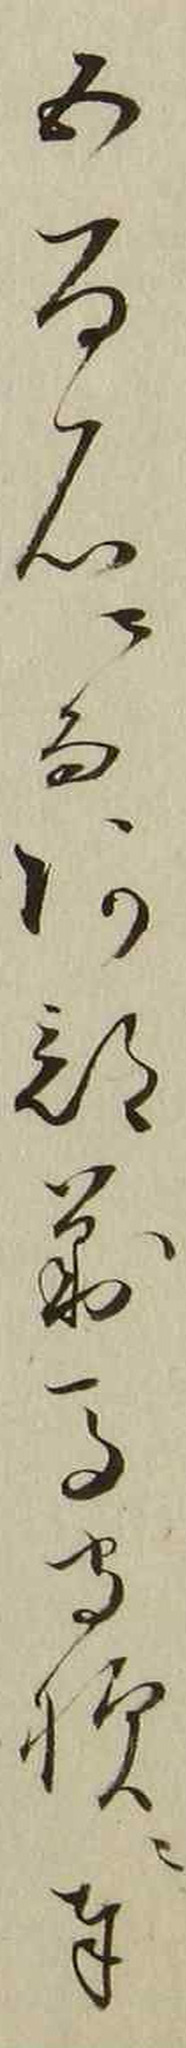五百石ニ而阿部対馬守様ニ奉
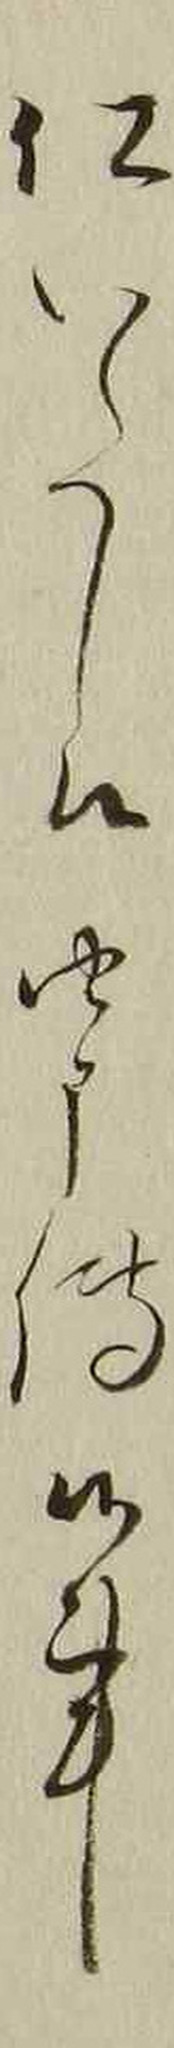仕いたし候由申伝候事
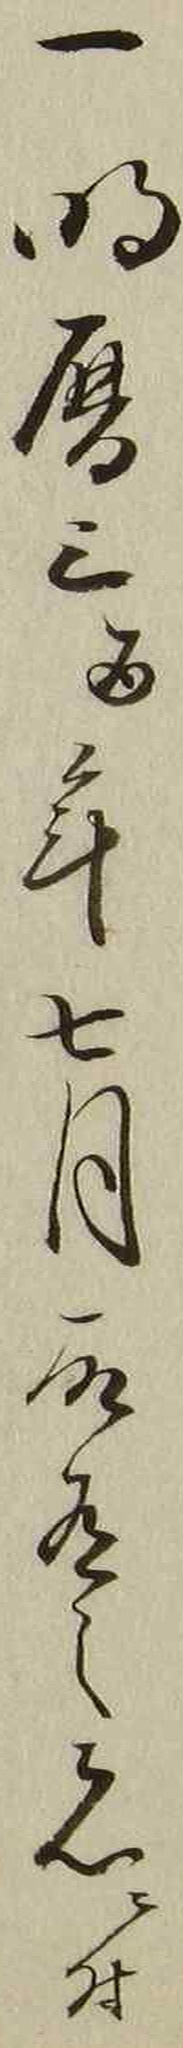一明暦三酉年七月故有之者ニ付
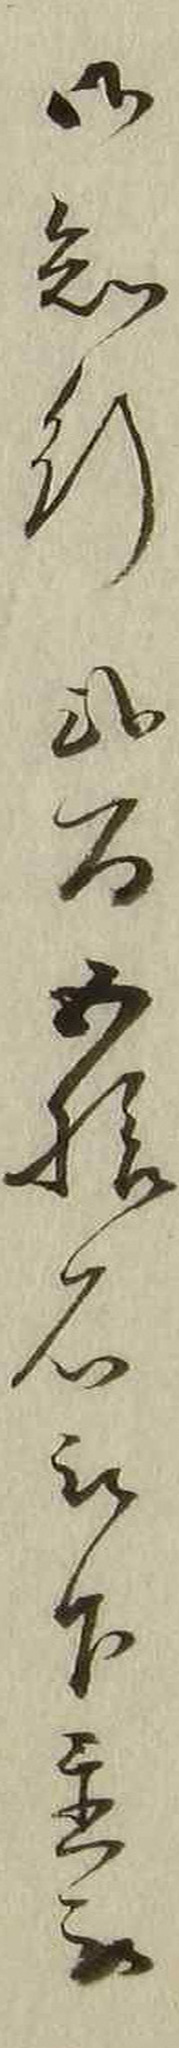御知行弐石五拾石被下置被
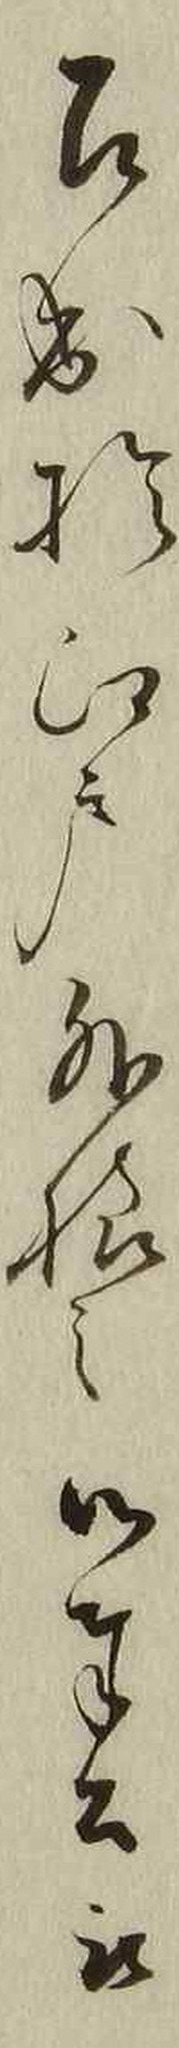召出於江戸外様之御奉公被
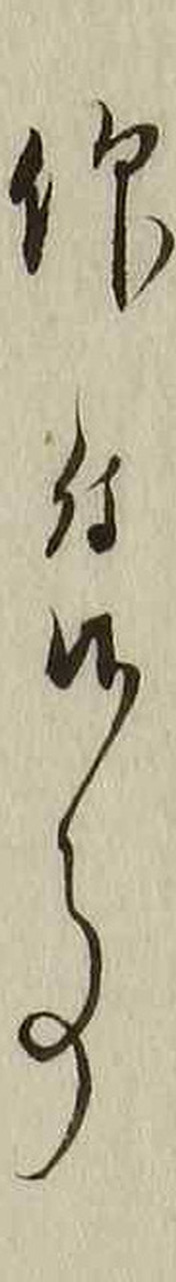仰付候事
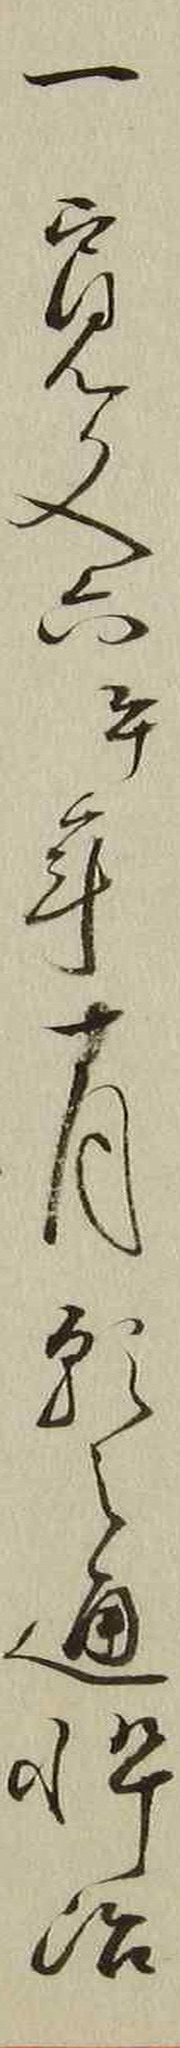一寛文六午年十月願之通忰治
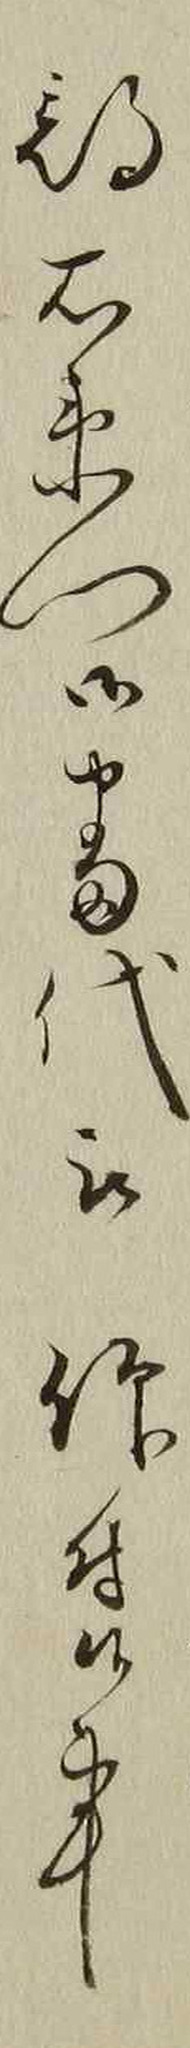部右衛門御番代被仰付候事
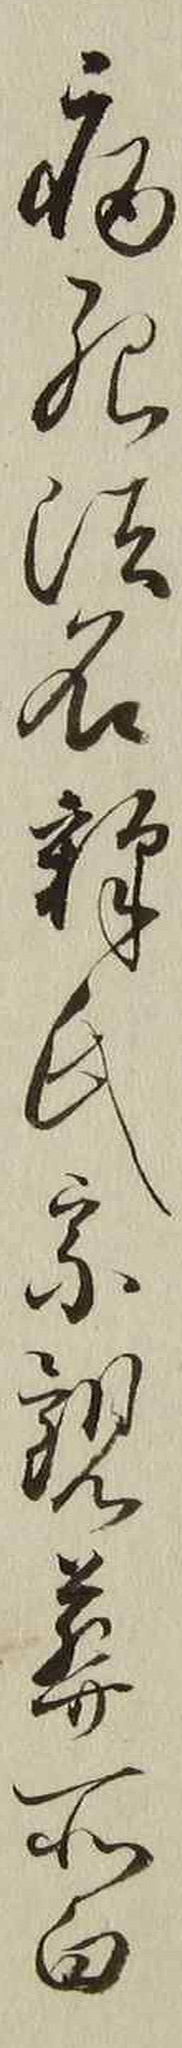病死法名釈氏家親葬所白
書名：諸士系譜　巻之129　た之部5
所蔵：会津若松市立会津図書館
